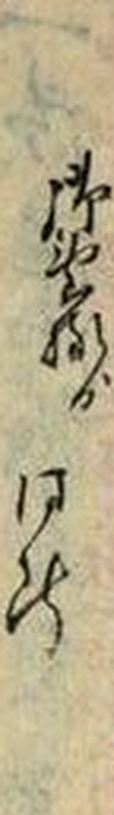御台様ゟ同断
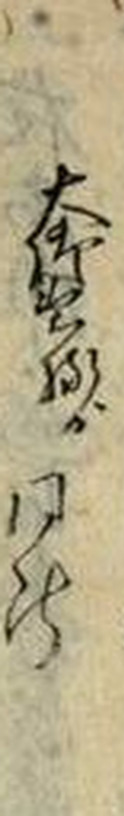大御台様ゟ同断

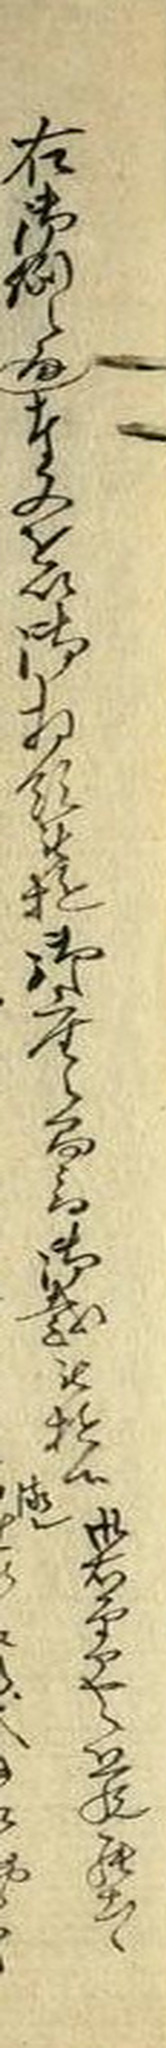右御例之通奉文を以御拝領被遊御座之間ニ而御戴被遊候御右筆部やへ恐悦罷出候
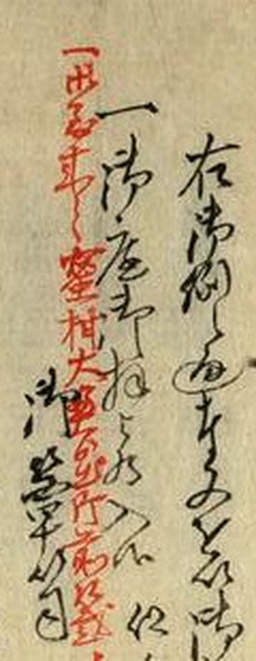一御庭御拝被為入候
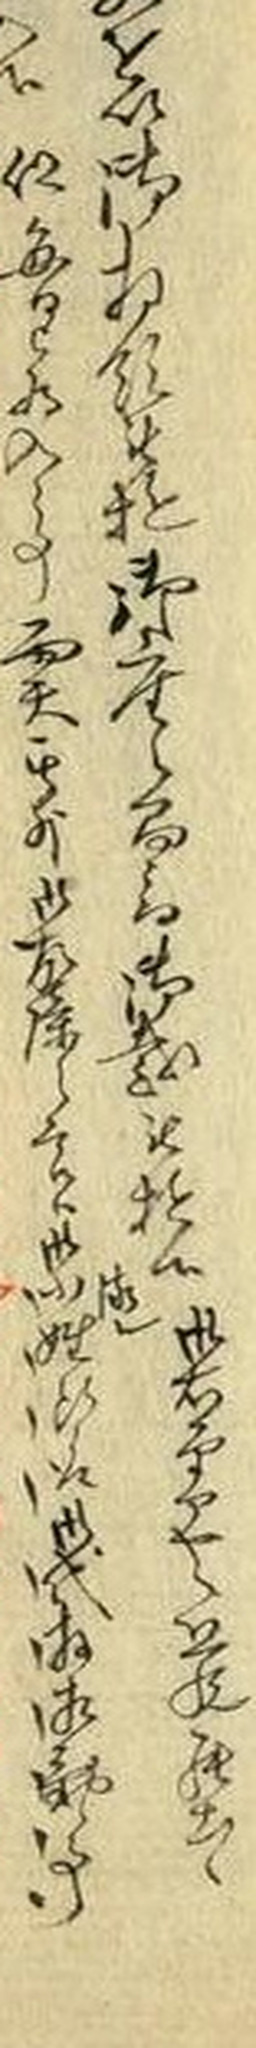但毎日被為入候事雨天其外御故障之節ハ御流レ小姓頭取御代相相勤候事
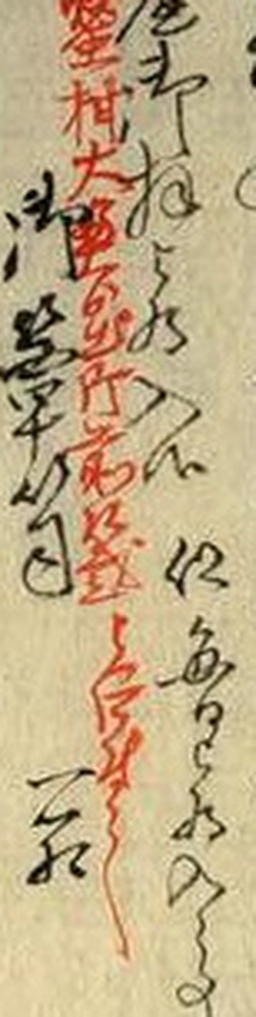御箪笥一箱
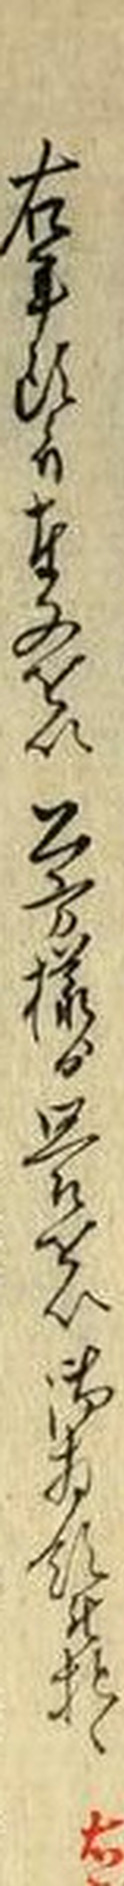右年頭ニ付奉文を以公方様ゟ思召を以御拝領被遊候
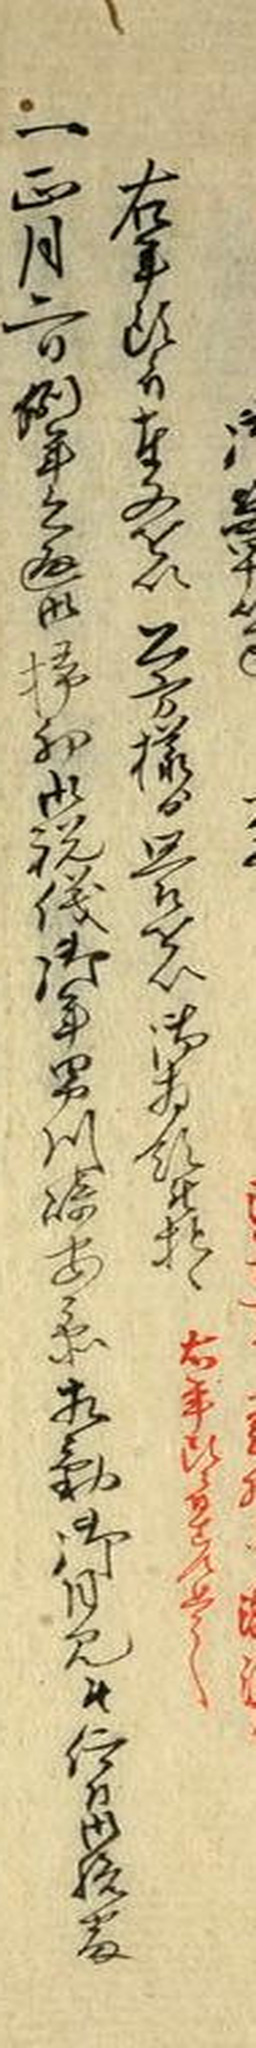一正月二日例年之通御掃初御祝儀御年男川崎安兵衛相勤御目見被仰付御膳番
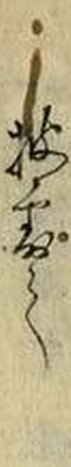披露之
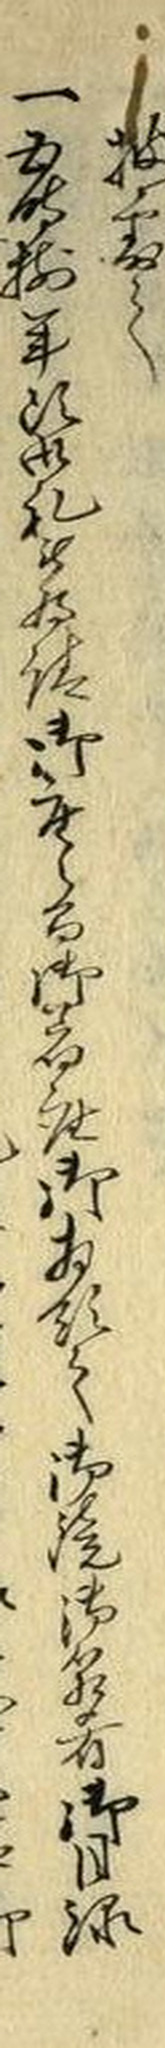一五時揃年頭御礼被為請御座之間御着座御拝領之御鏡御箱肴御目録
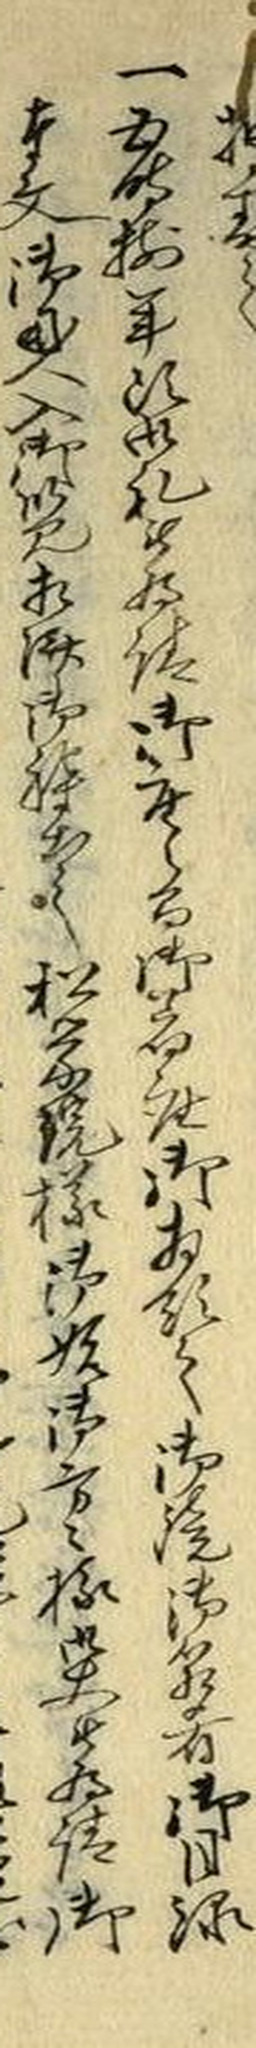奉文御用人入御覧相済御持出之松栄院様御始御方々様御使被為請御
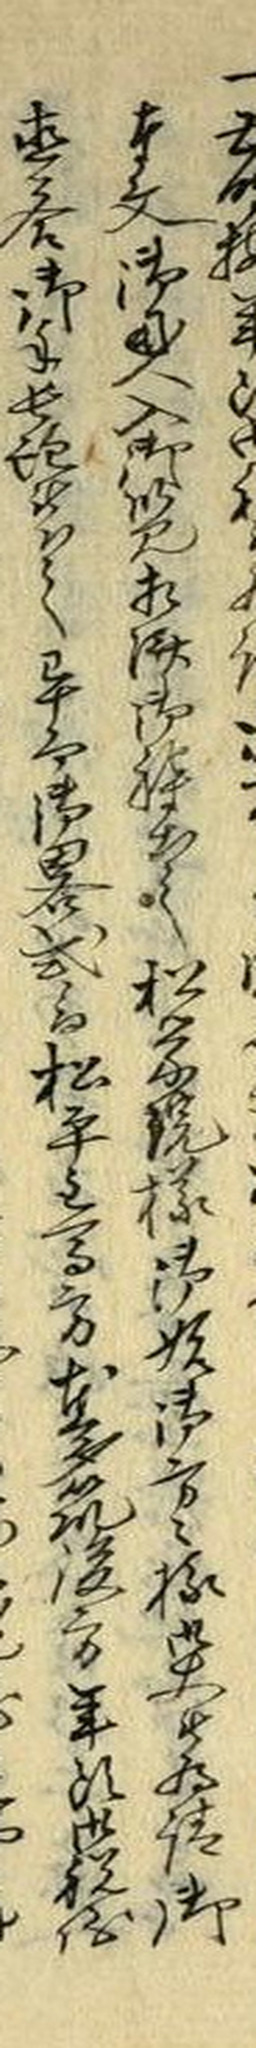直答御手長鮑被下之畢而御略式ニ而松平主馬方本多筑後方年頭御祝儀
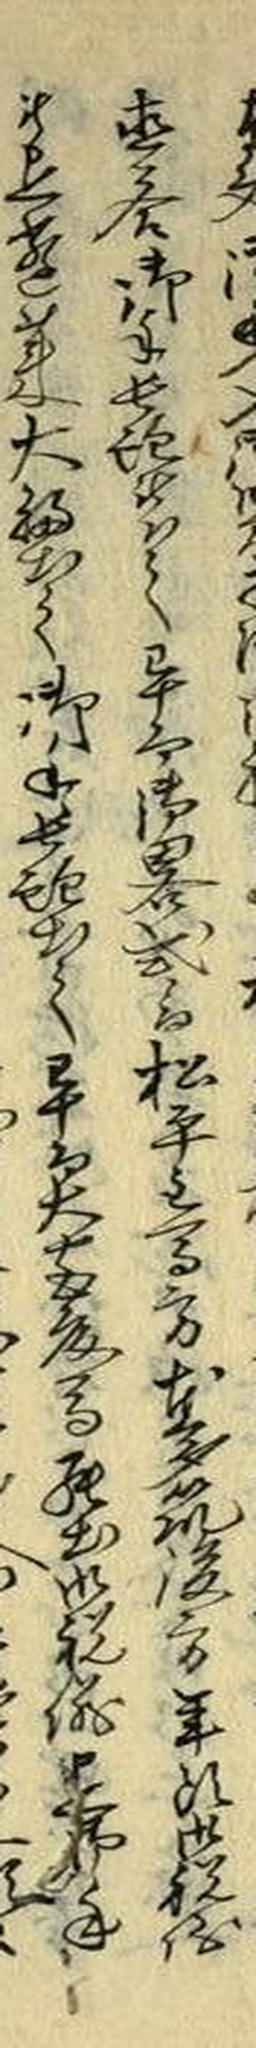被申上蓬莱大福出之御手長鮑出之畢而大宮藤馬罷出御祝儀申上御手
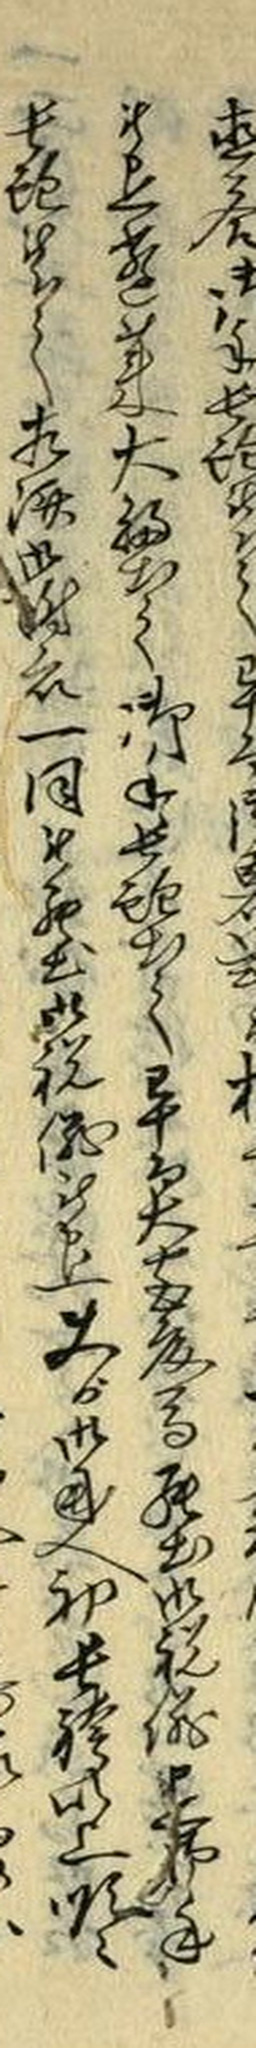長鮑被下之相済御附衆一同被罷出御祝儀被申上夫ゟ御用人初長袴以上順々
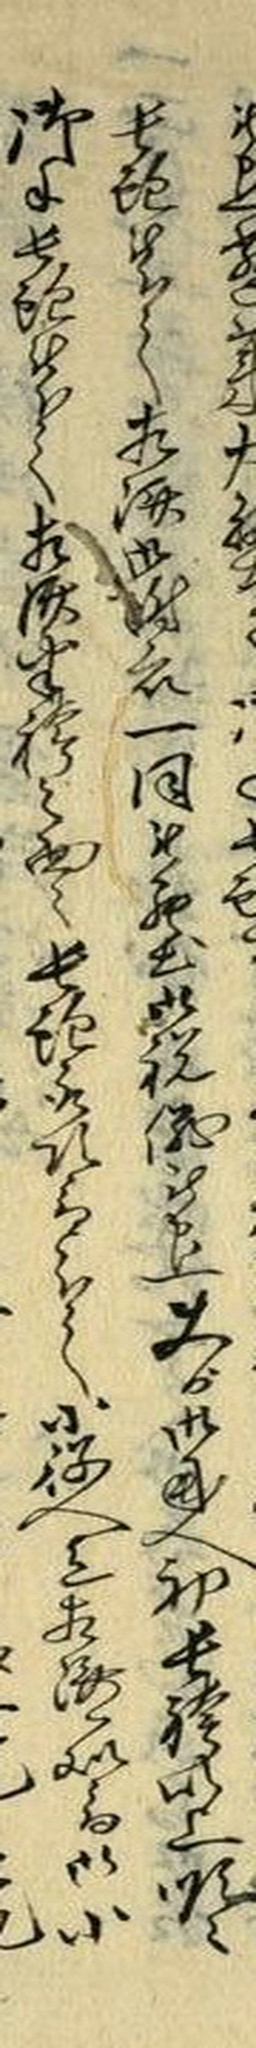御手長鮑被下之相済半袴之面々長鮑取次ニ而被下之小役人迄相済候処ニ而御小
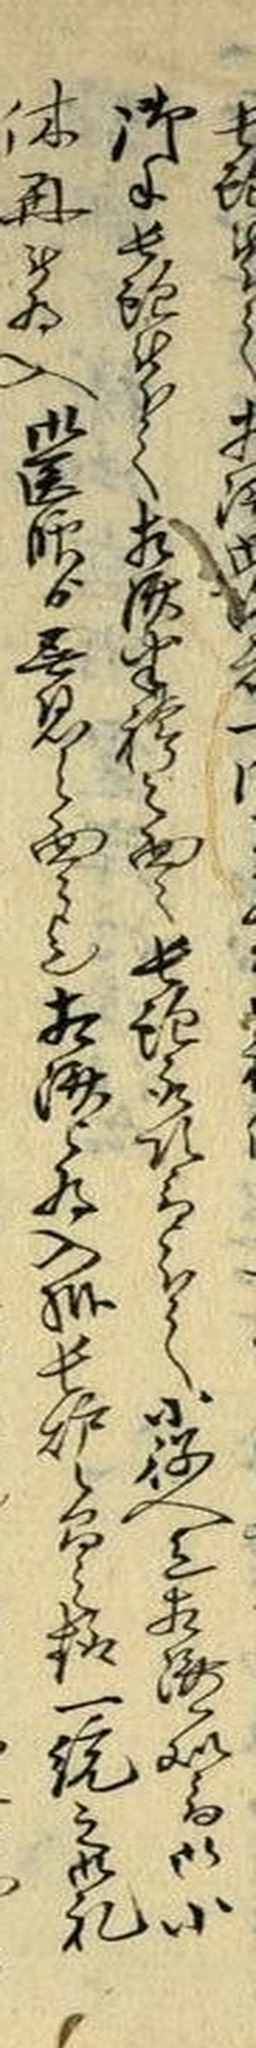休再被入御医師ゟ無息之面々迄相済被為入掛長炉之間ニ趣一統之御礼
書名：少傅日録抄（斉善付側向頭取日記、江戸并道中、初入在国、逝去後…
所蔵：福井県文書館 Fukui Prefectural Archives
